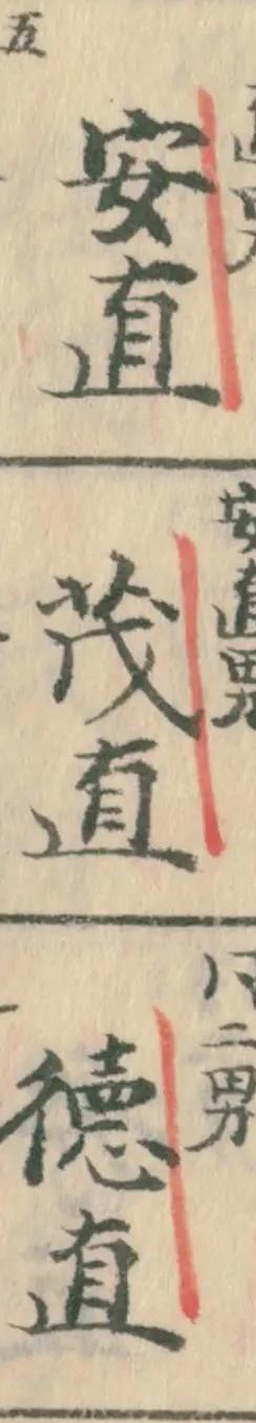安直茂直徳直
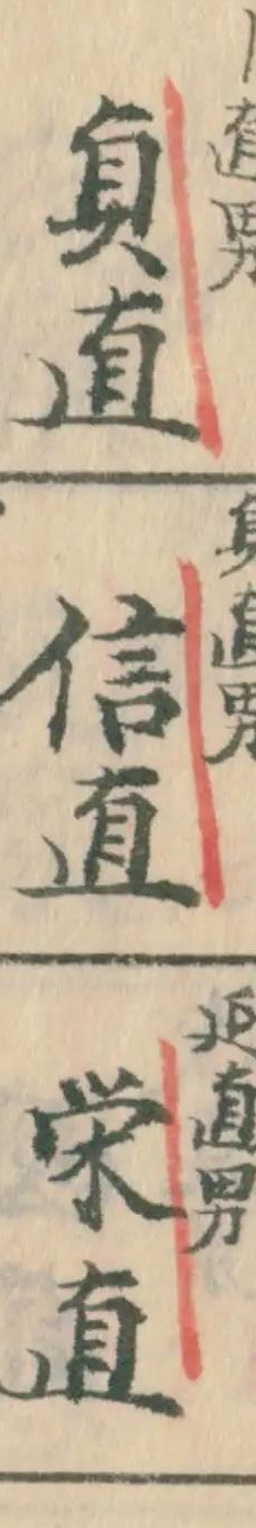貞直信直栄直

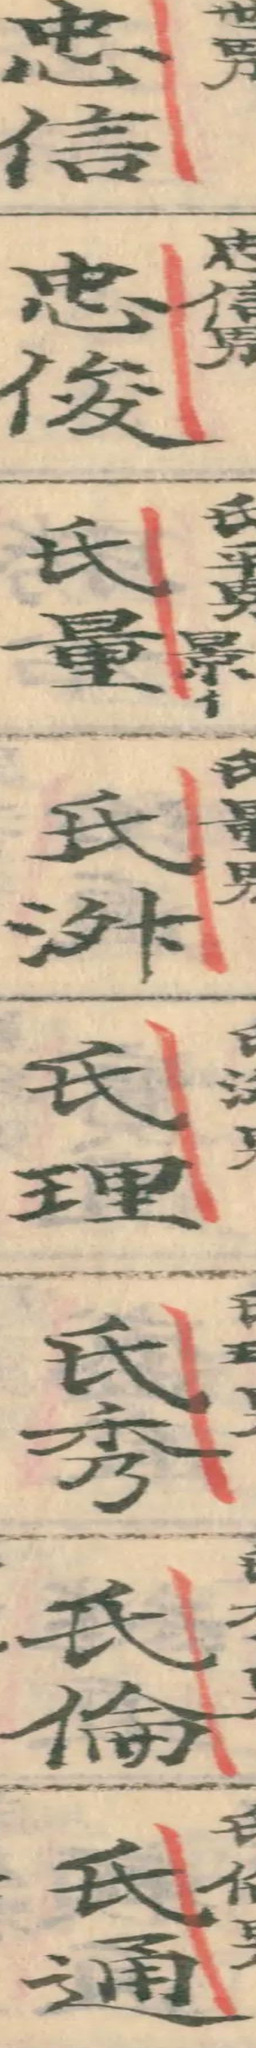忠信忠俊氏量氏氏理氏秀氏倫氏通
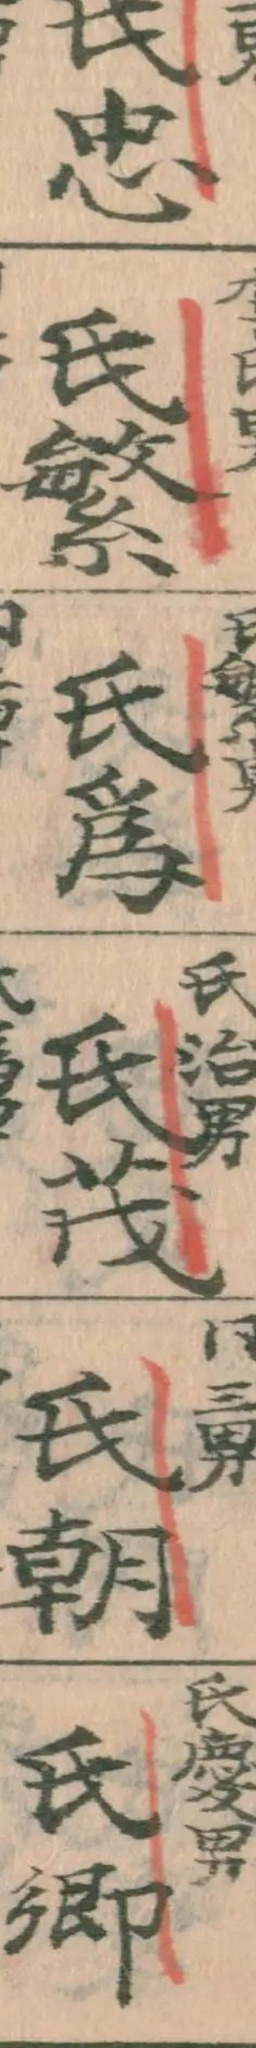雅氏氏忠氏繁氏為氏茂氏朝氏郷
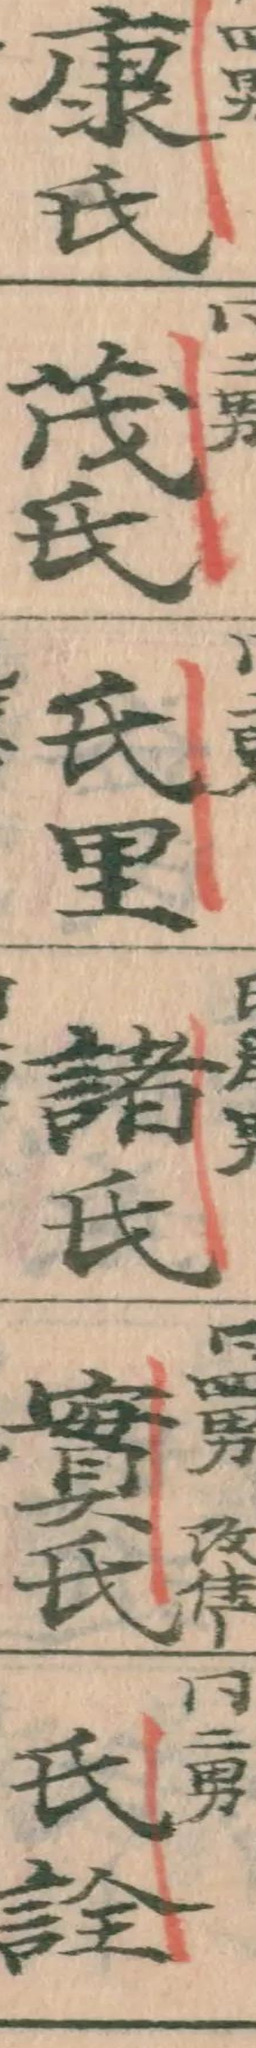忠通康氏茂氏氏里諸氏實氏氏詮
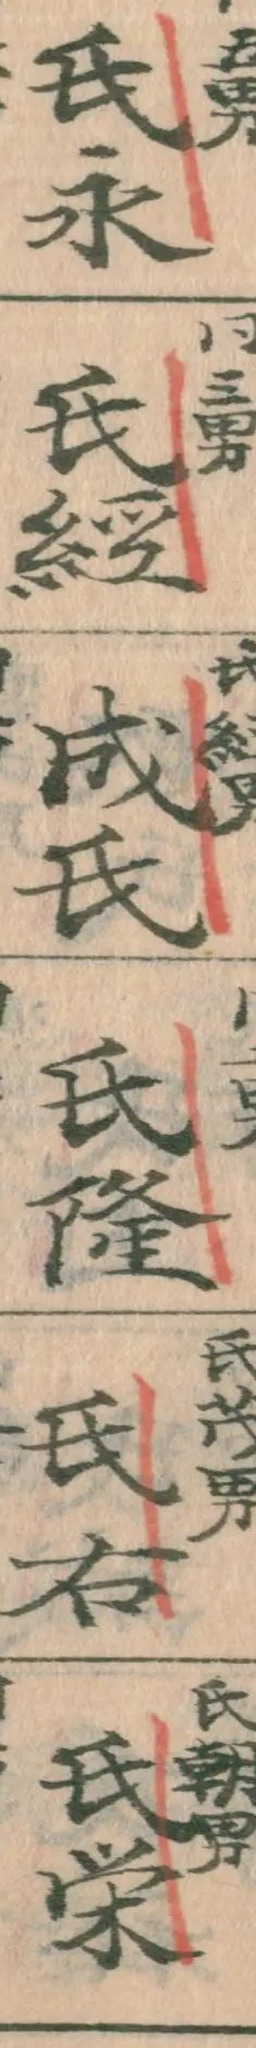氏永氏経成氏氏隆氏右氏栄
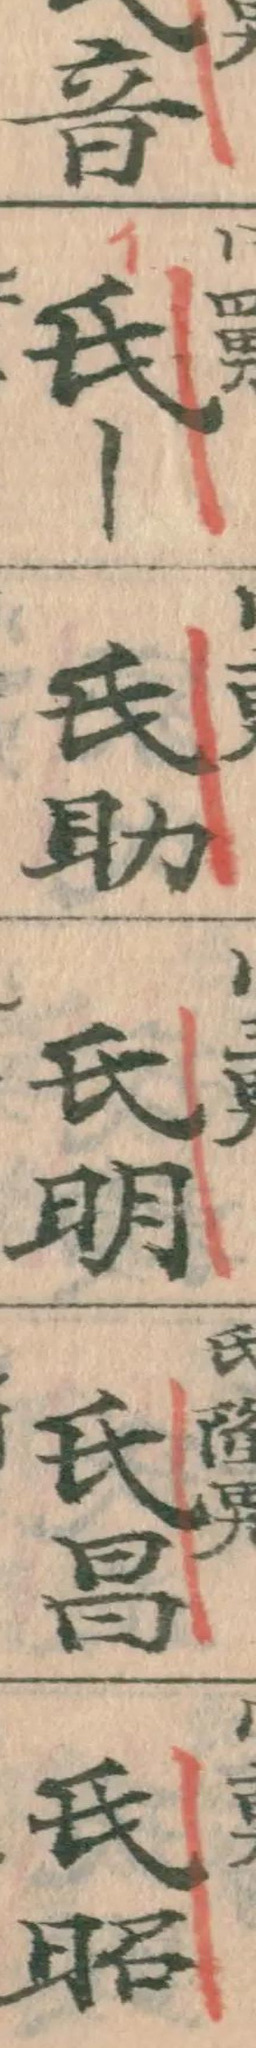氏音イ氏ー氏助氏明氏昌氏昭
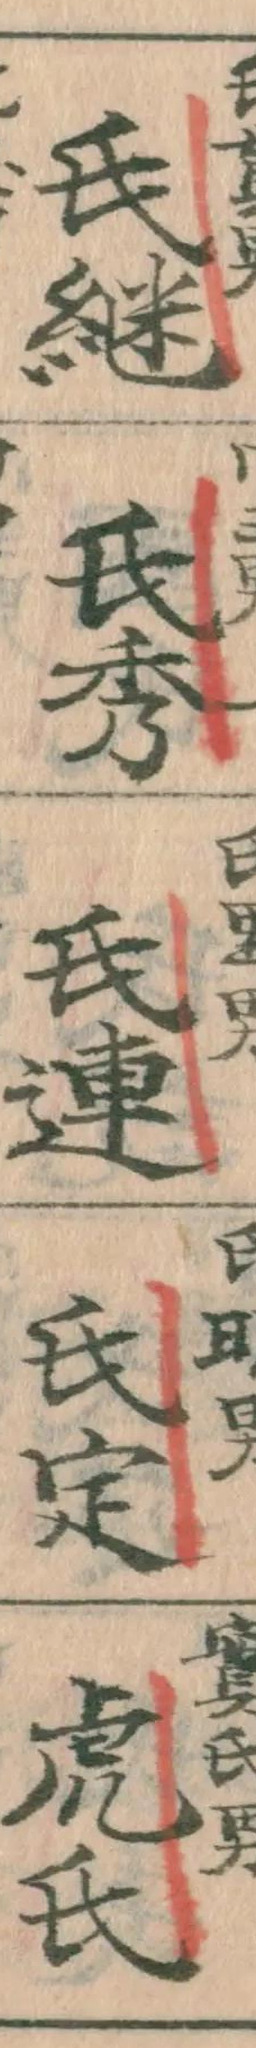氏継氏秀氏連氏定虎氏
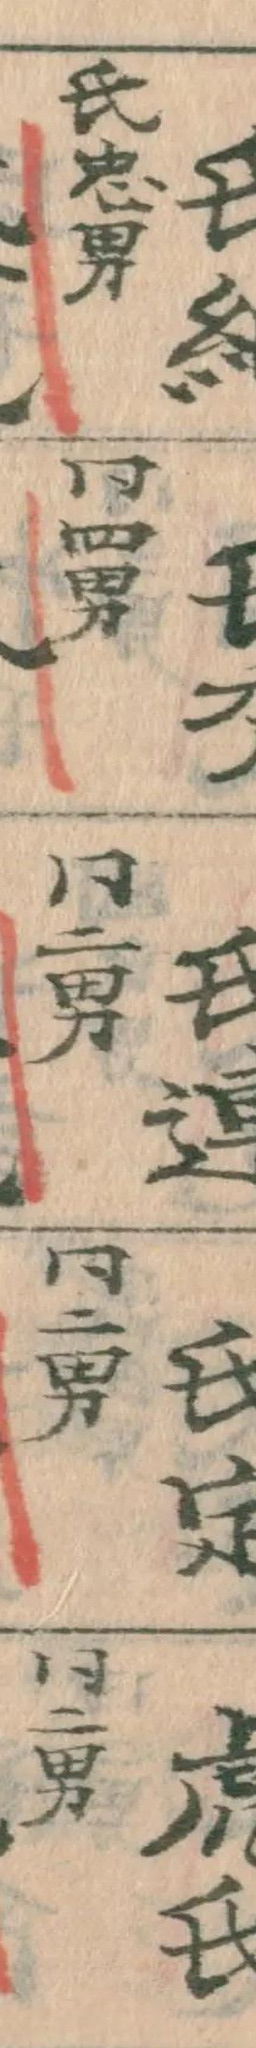氏忠男同四男同二男同二男同二男
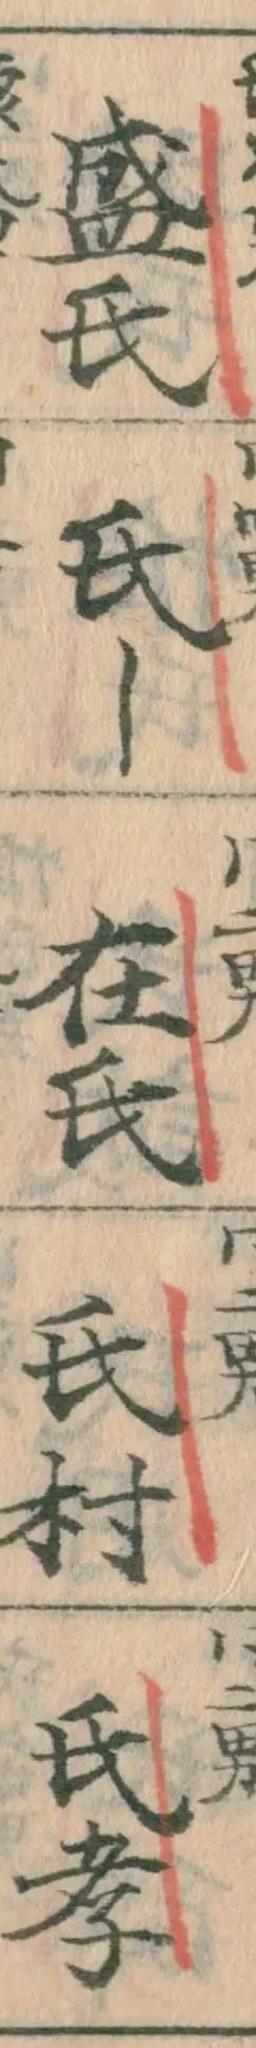盛氏氏ー在氏氏村氏孝
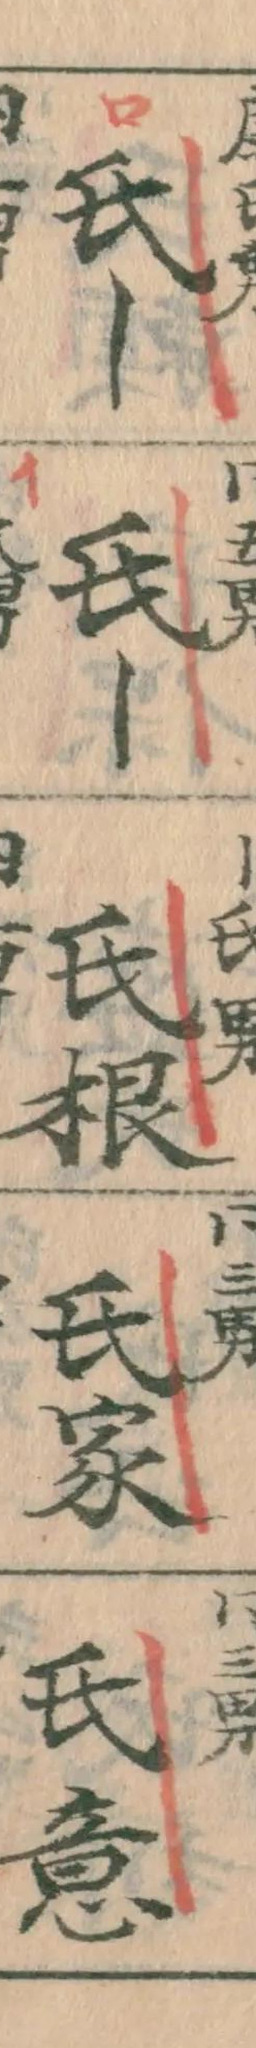ロ氏ー氏ー氏根氏家氏意
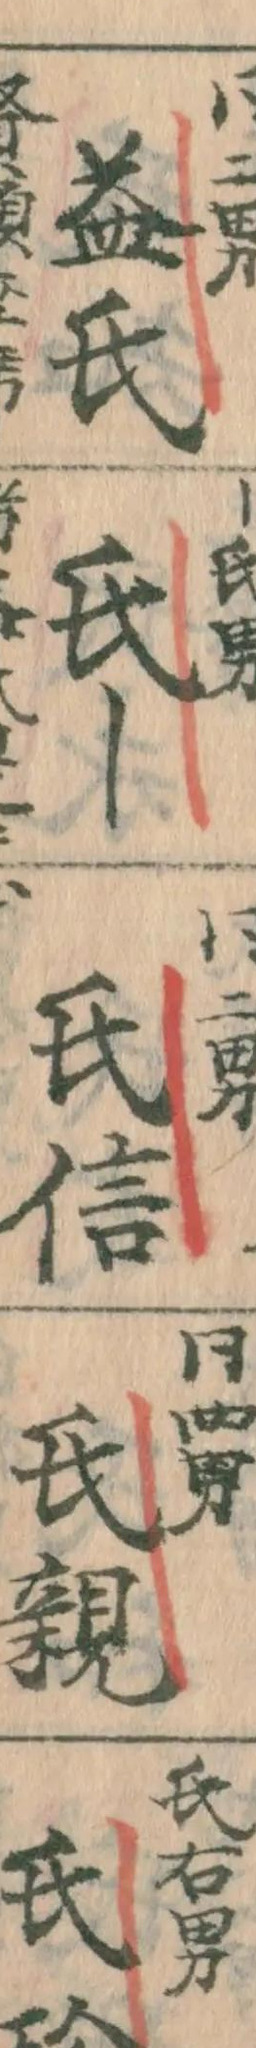益氏氏ー氏信氏親氏珍

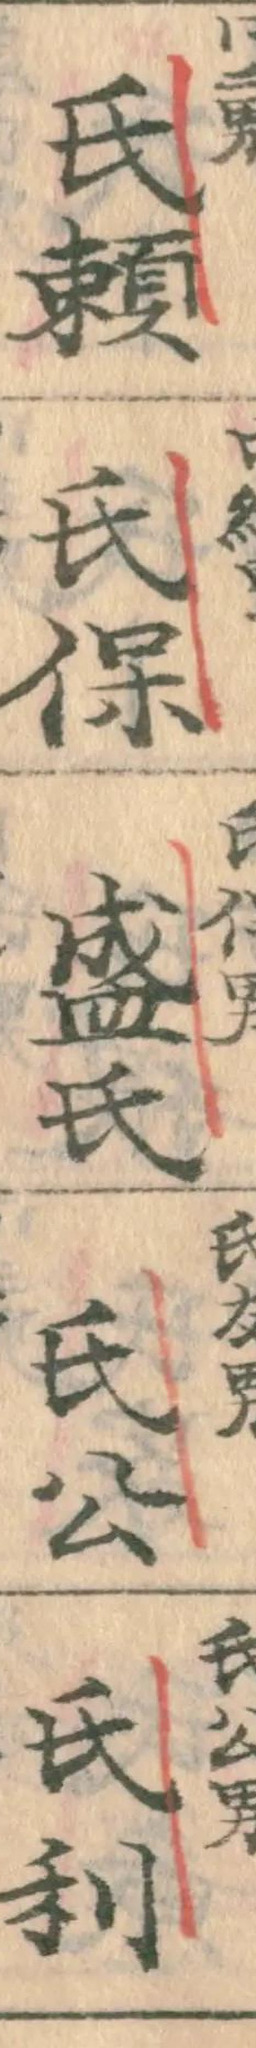氏賴氏保盛氏氏公氏利
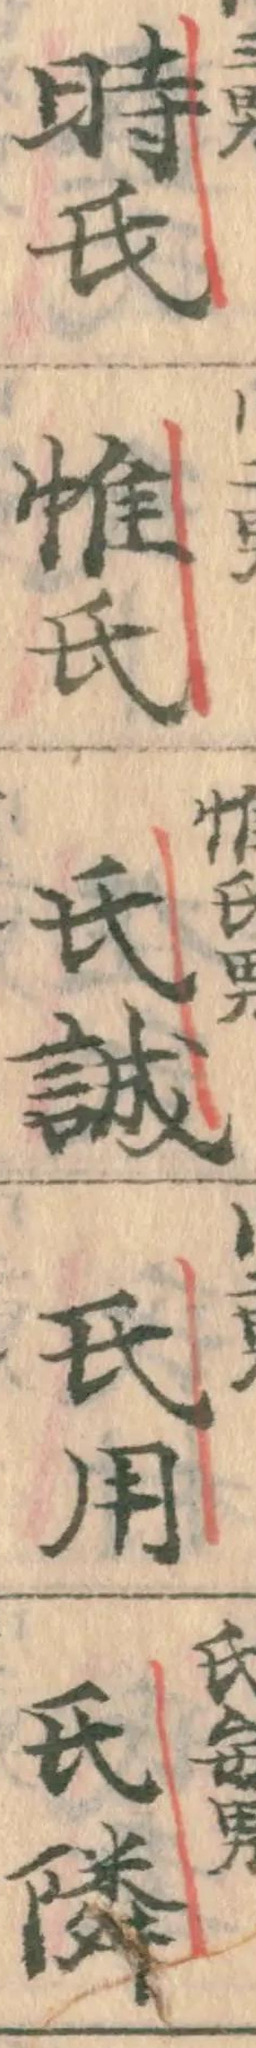時氏惟氏氏誠氏用氏隣
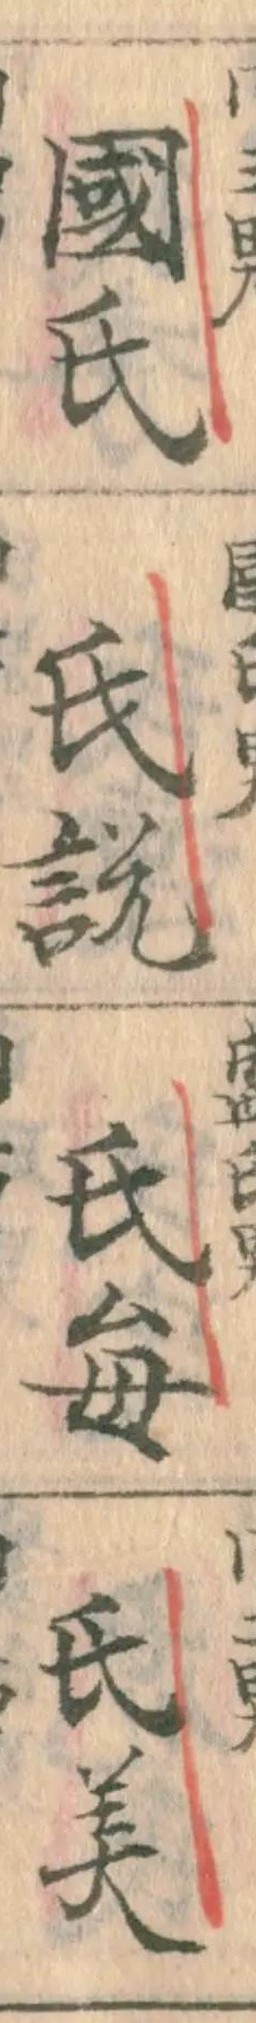国氏氏説氏毎氏美
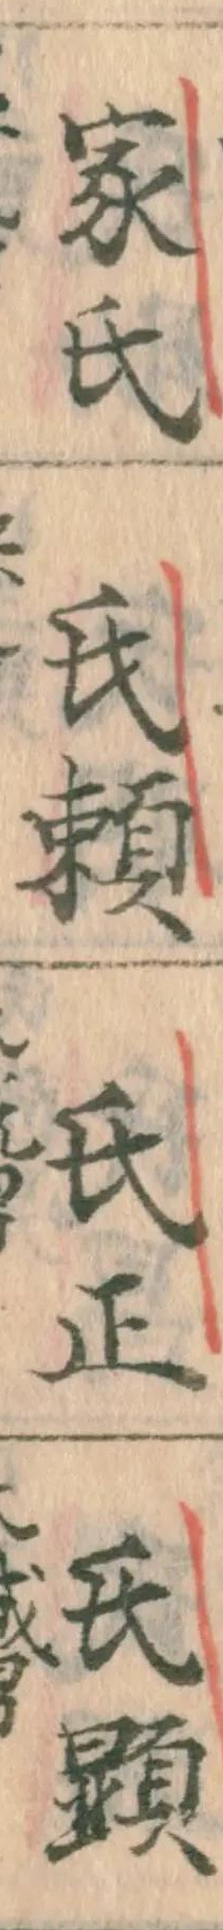家氏氏賴氏正氏顕
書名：賀茂社記録. 第24冊
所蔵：国立国会図書館 National Diet Library, JAPAN
